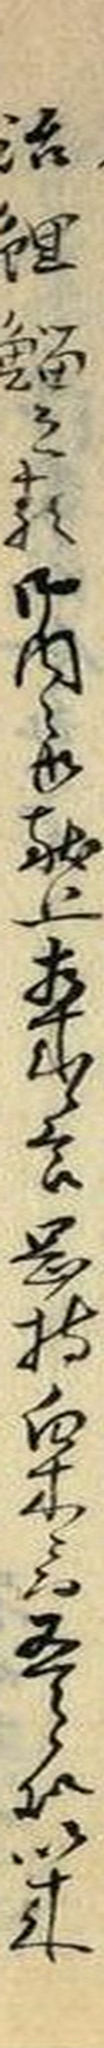活鯉鯔之類御内々御献上相成候節岡持白木ニ而有之候処以来
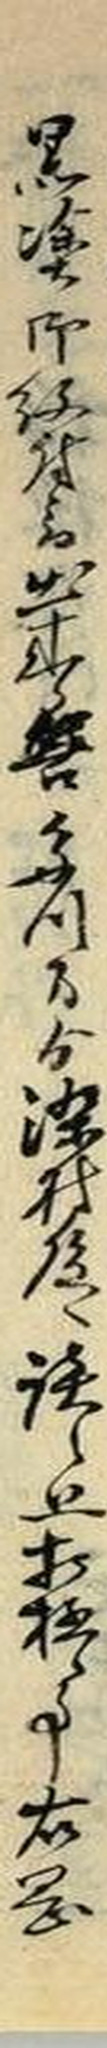黒塗御紋付ニ而出来候筈多川方ゟ染村殿へ談之上相極候事右岡
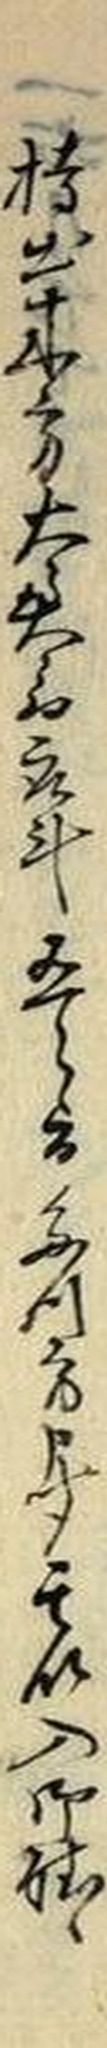持出来方大奥ニ而取斗有候旨多川方申聞其段入御聴候
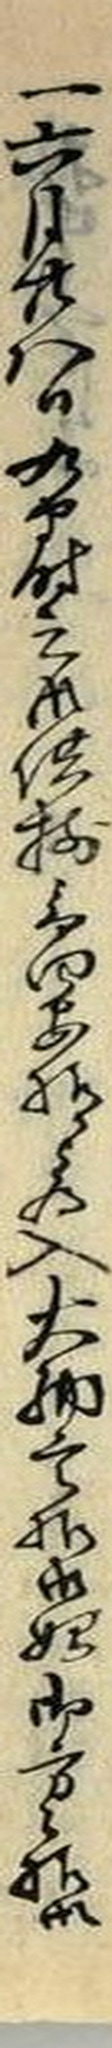一六月廿八日九半時之御供揃ニ而田安様へ被為入大納言様御始御方々様御
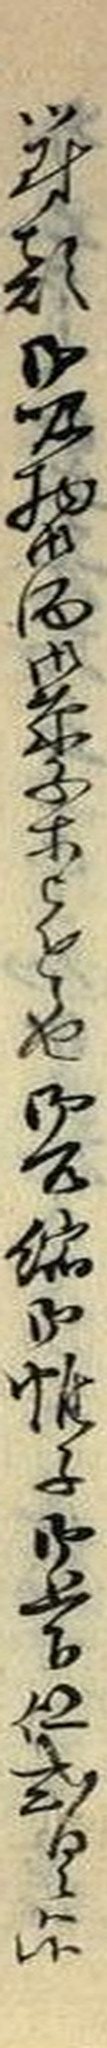対顔御吸物御酒御菓子等被進候由御召縮御帷子御上下但式日ニハ候
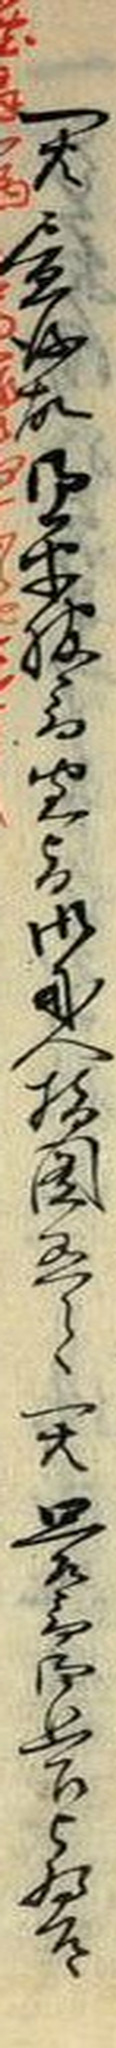へ共昼後故御平服ニ而宣旨御用人指図有之候へ共思召ニ而御上下被為召候
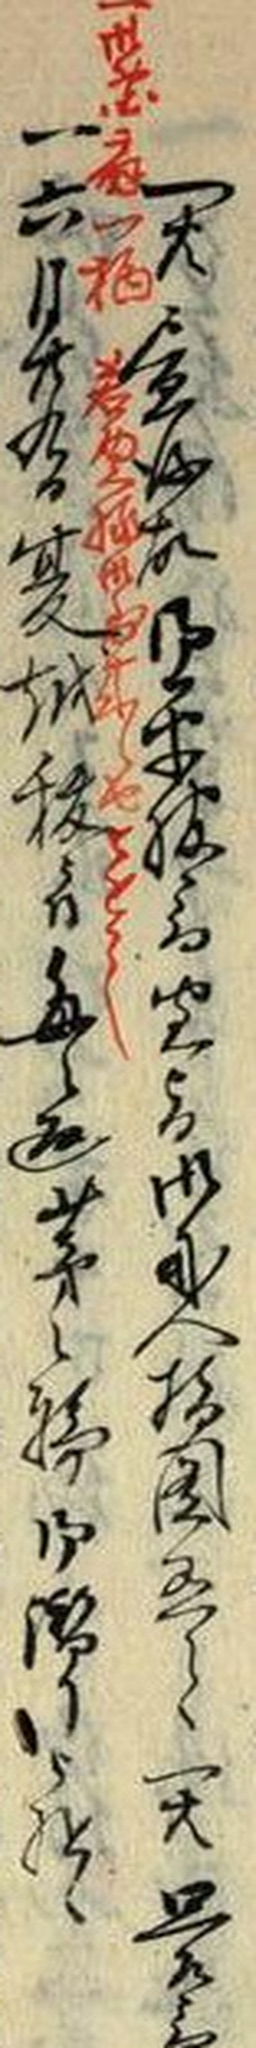一六月廿九日夏越祓ニ付毎之通茅之輪御潜り被遊候
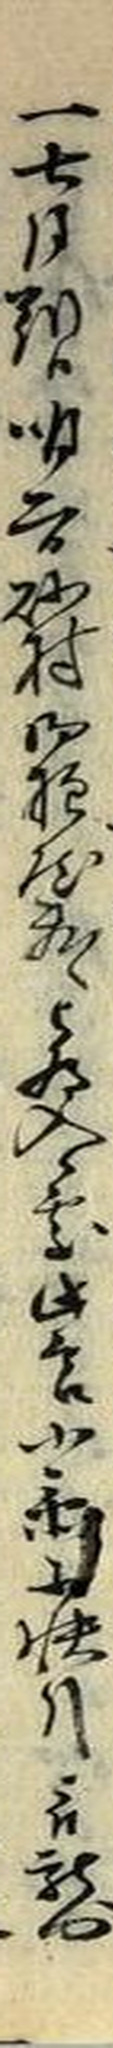一七月朔日明二日砂村御抱屋敷へ被為入候処此節小兵衛不快引ニ付新右衛門
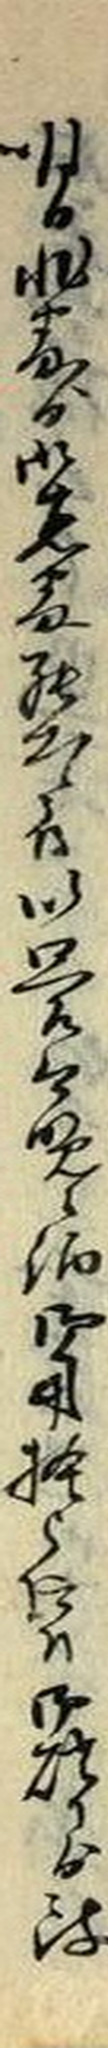明日非番ゟ御先番罷出候ニ付以思召今晩之泊御用捨被仰付御灯りゟ致
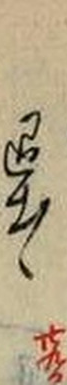退出候
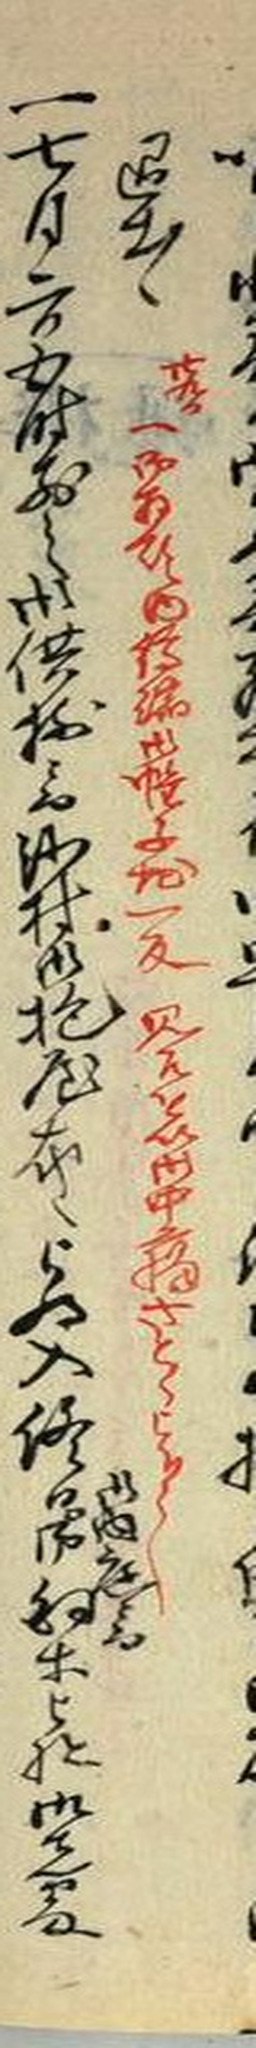一七月二日五時前之御供揃ニ而砂村御抱屋敷へ被為入終日御内庭ニ而御釣等被遊御先番
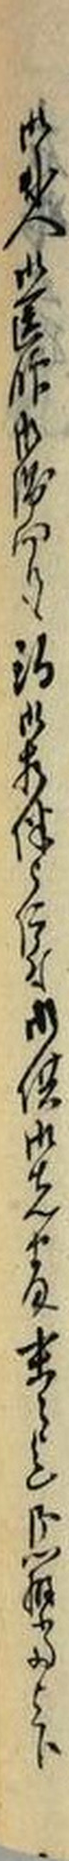御用人御医師御側向江も釣御相伴被仰付御供御先番未々迄御弁当被下
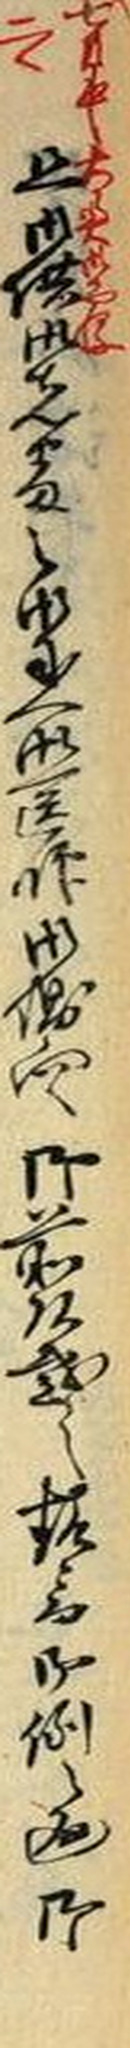且御供御先番之御用人御医師御側向へ御前頂戴之趣ニ而御例之通御
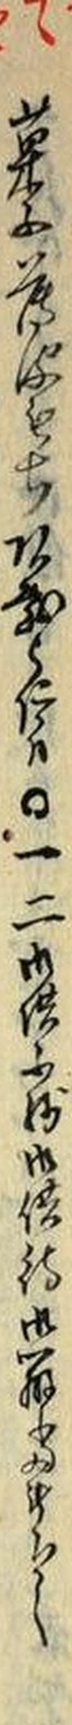菓子薄皮もち頂戴被仰付〇一二御供不残御供待御弁当被下之
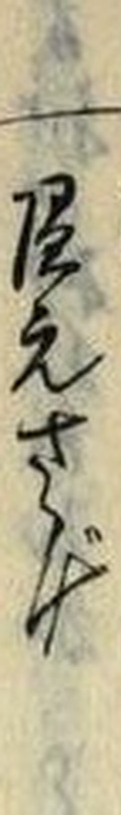隠元さゝげ
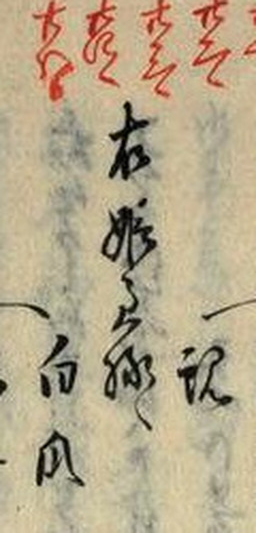右姫君様へ
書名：少傅日録抄（斉承付側向頭取日記、在府）
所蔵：福井県文書館 Fukui Prefectural Archives
